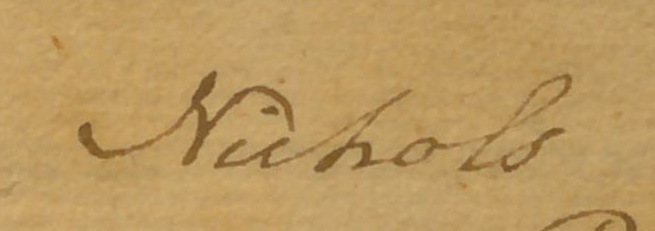Nichols
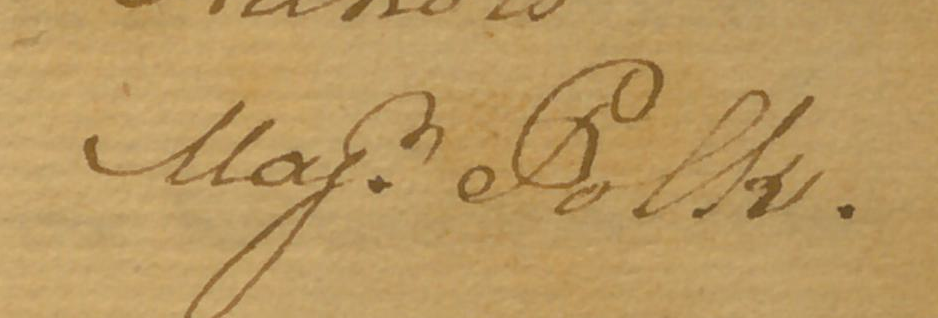Maj^r. Polk.
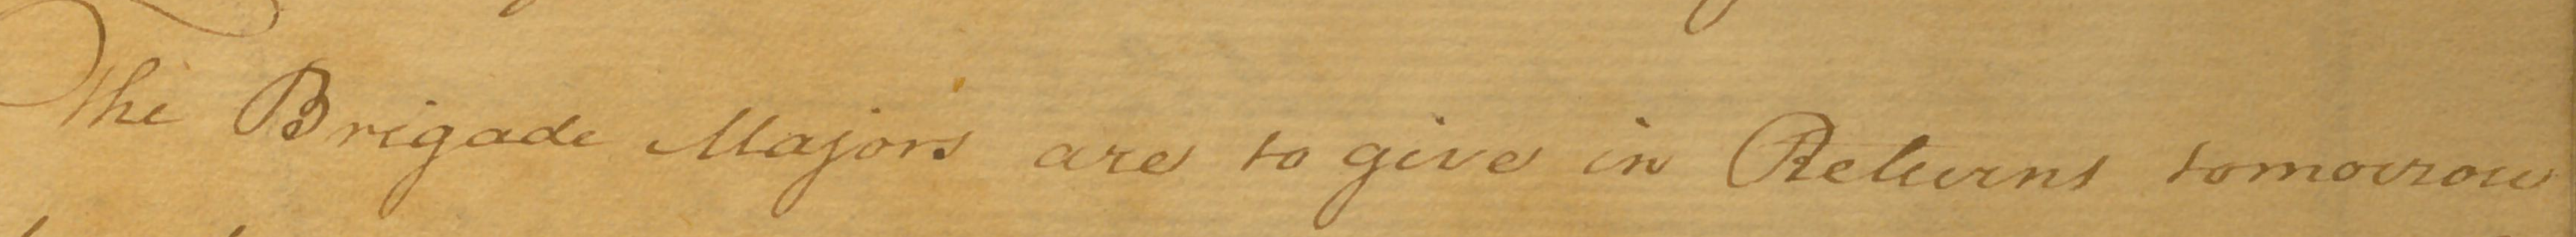The Brigade Majors are to give in Returns tomorrow
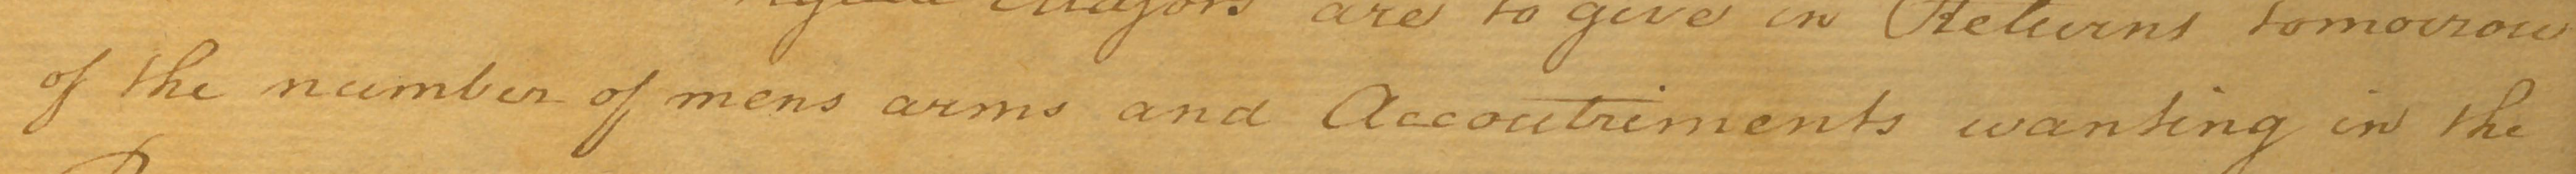of the number of mens arms and Accoutriments wanting in the
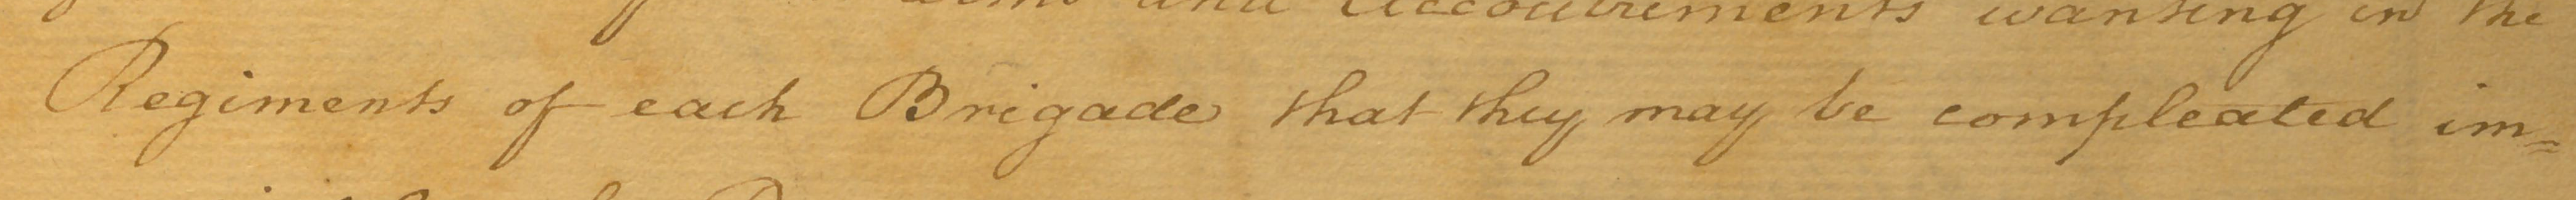Regiments of each Brigade that they may be compleated im-
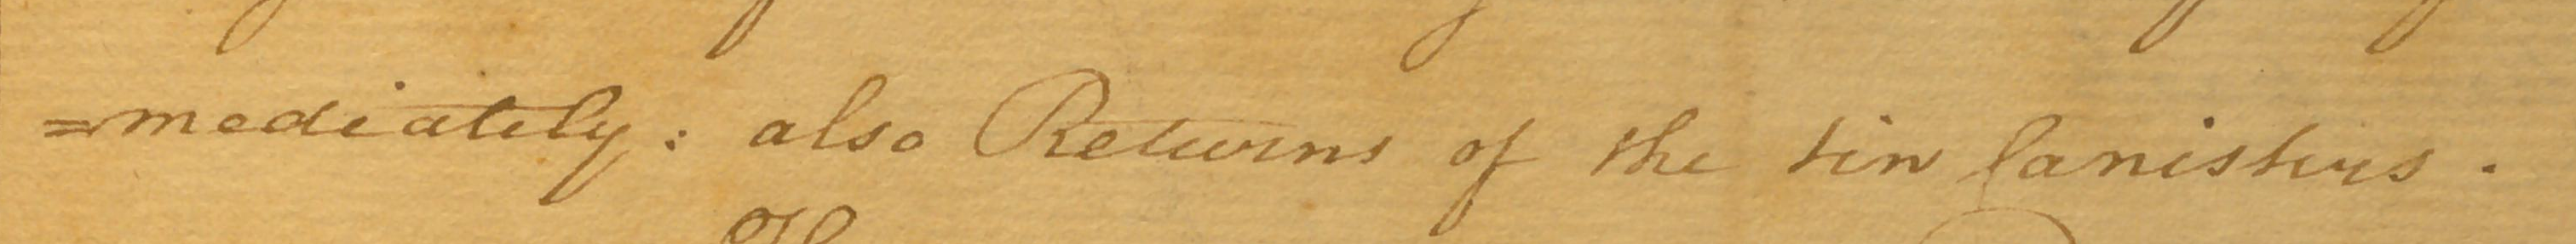-mediately: also Returns of the tin Canisters.
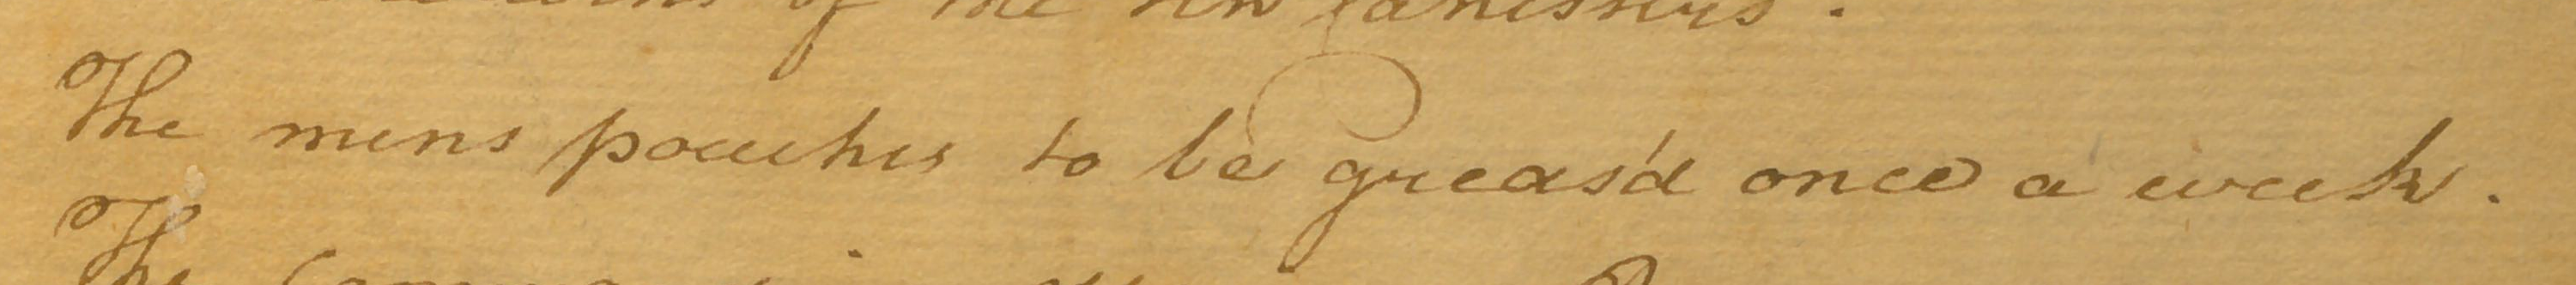The mens pouches to be greas'd once a week.
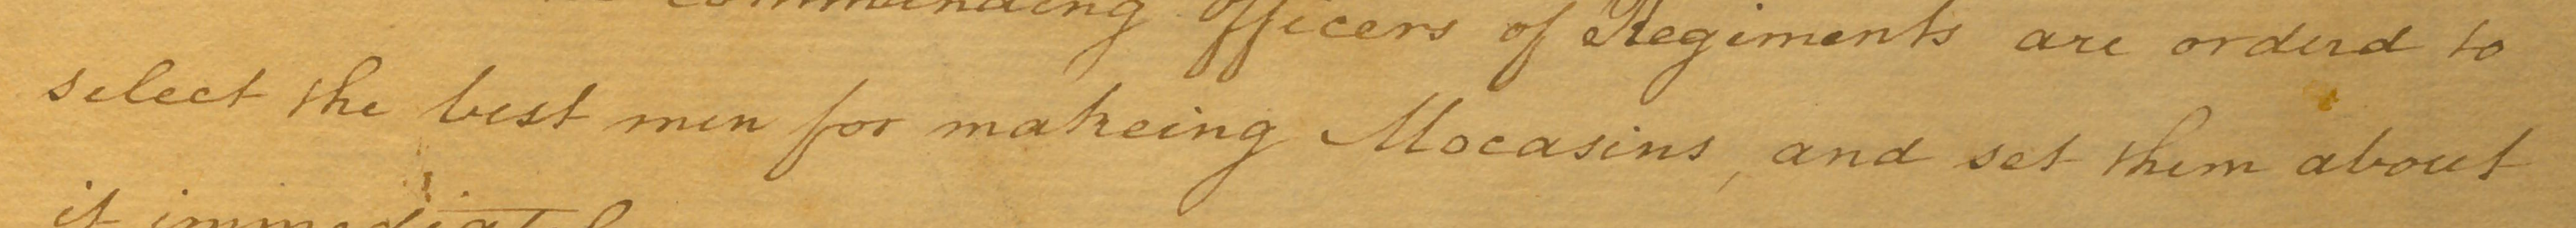select the best men for makeing Mocasins and set them about
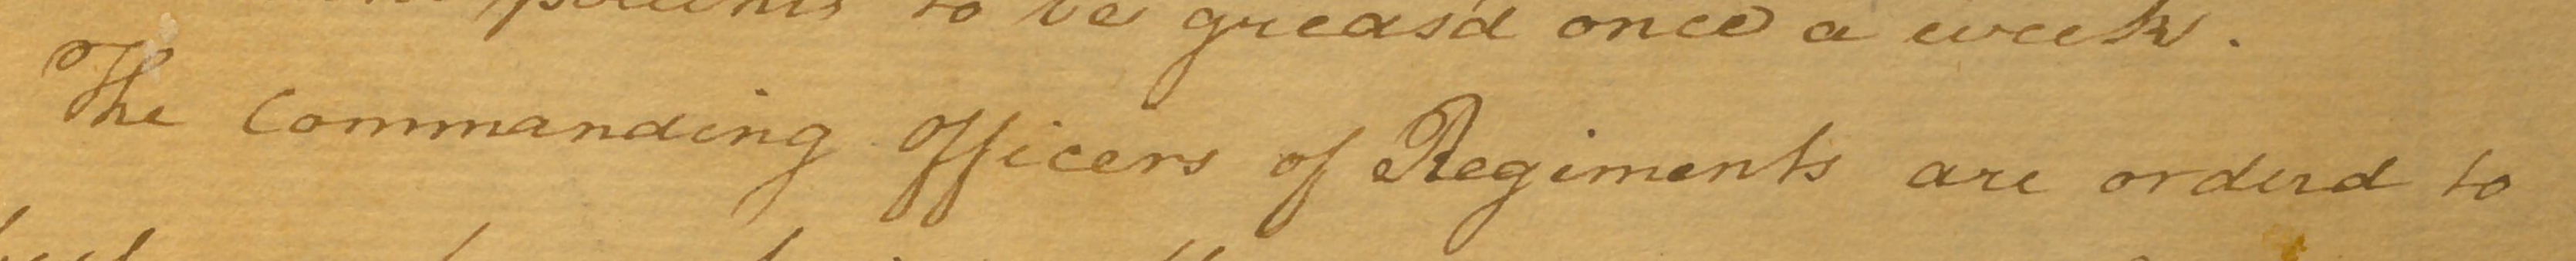The Commanding officers of Regiments are orderd to
